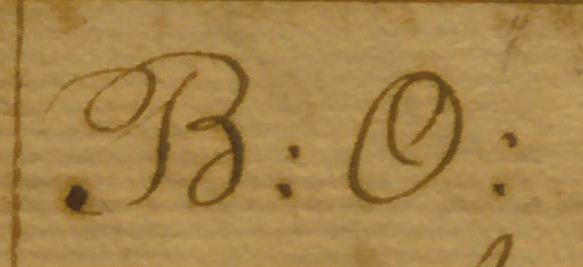B: O:
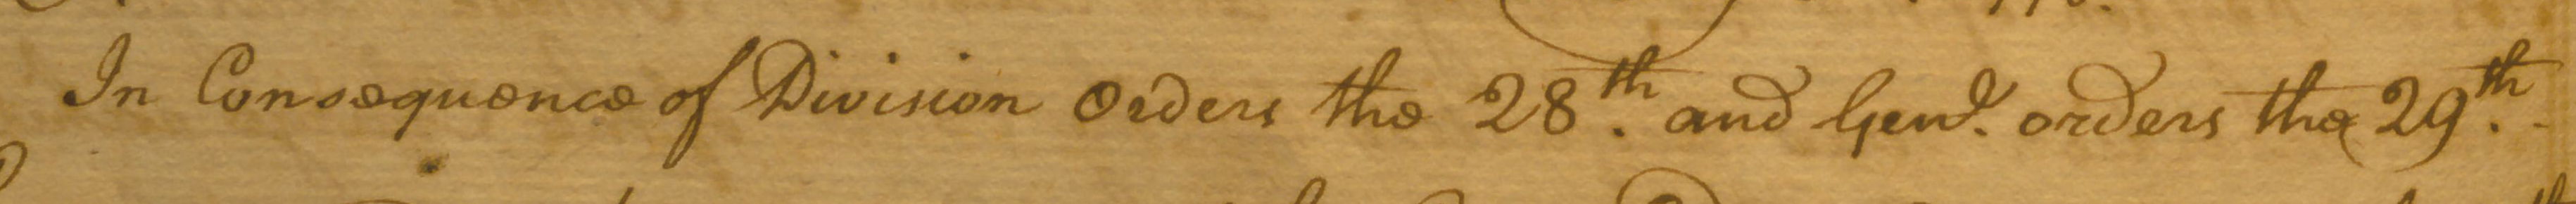In Consequence of Division orders the 28^th. and Gen^l. orders the 29^th.
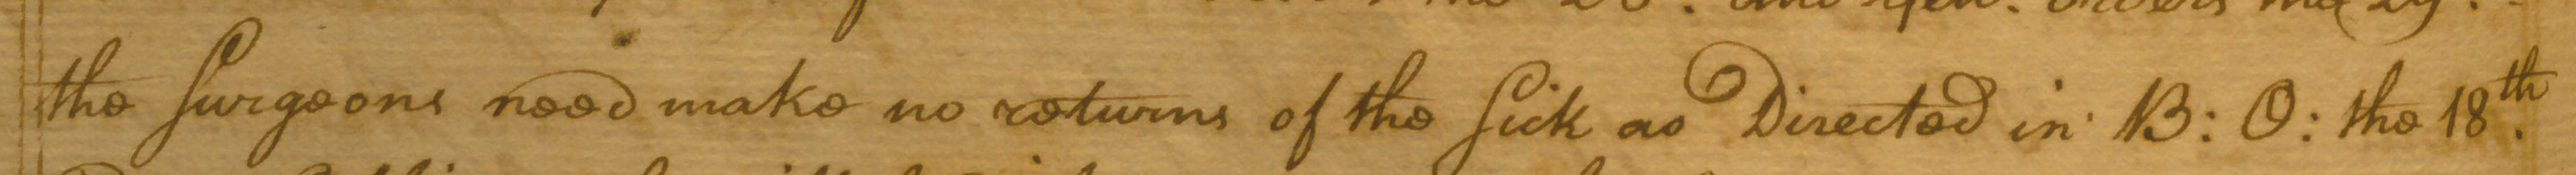the surgeons need make no returns of the sick as Directed in B: O: the 18^th.
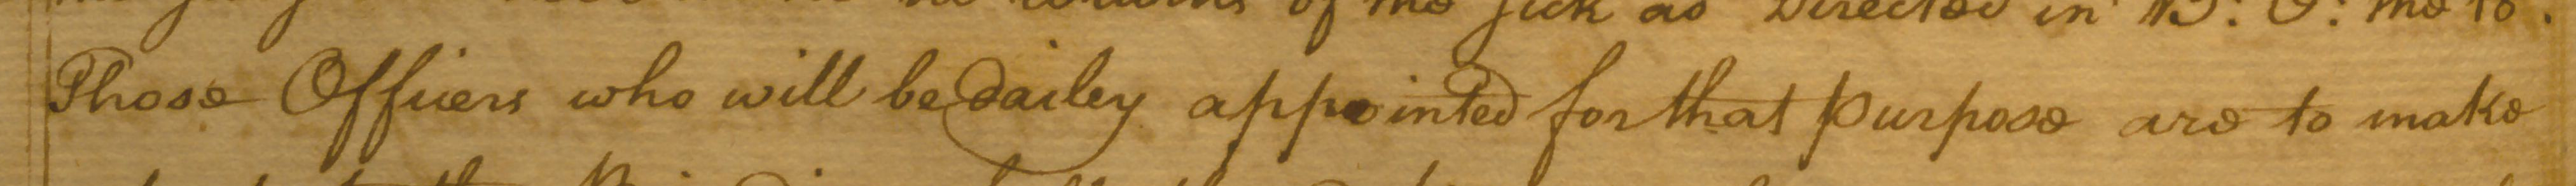Those Officers who will be dailey appointed for that purpose are to make
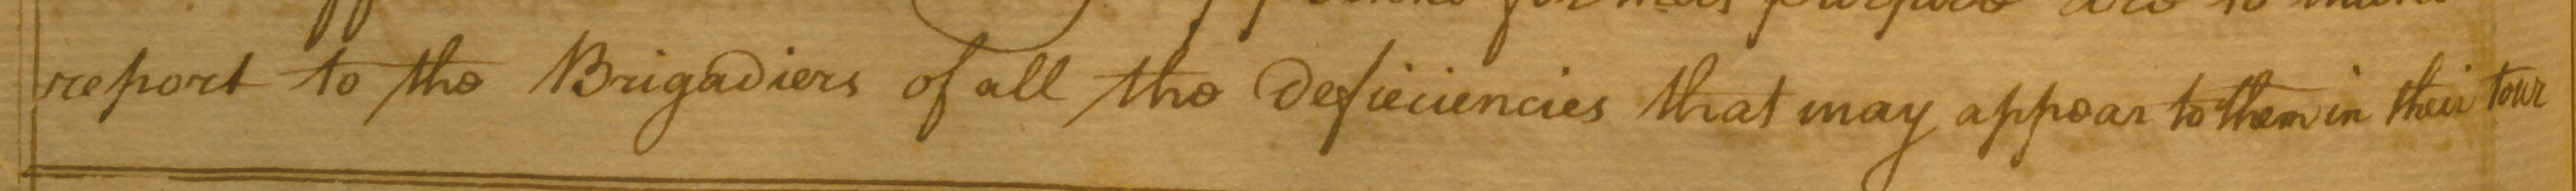report to the Brigadiers of all the deficiencies that may appear to them in their time
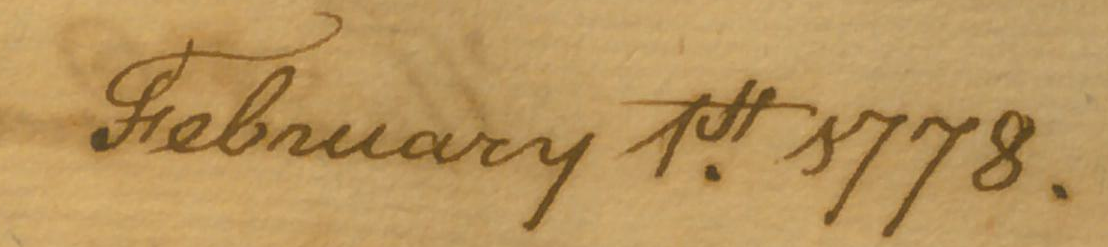February 1^st. 1778.
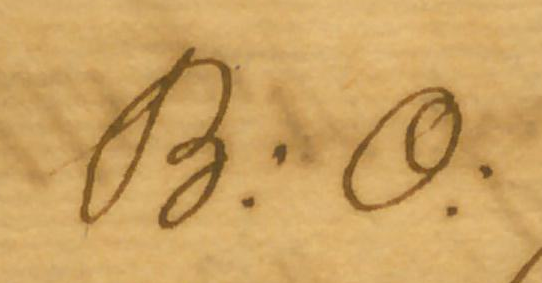B: O:
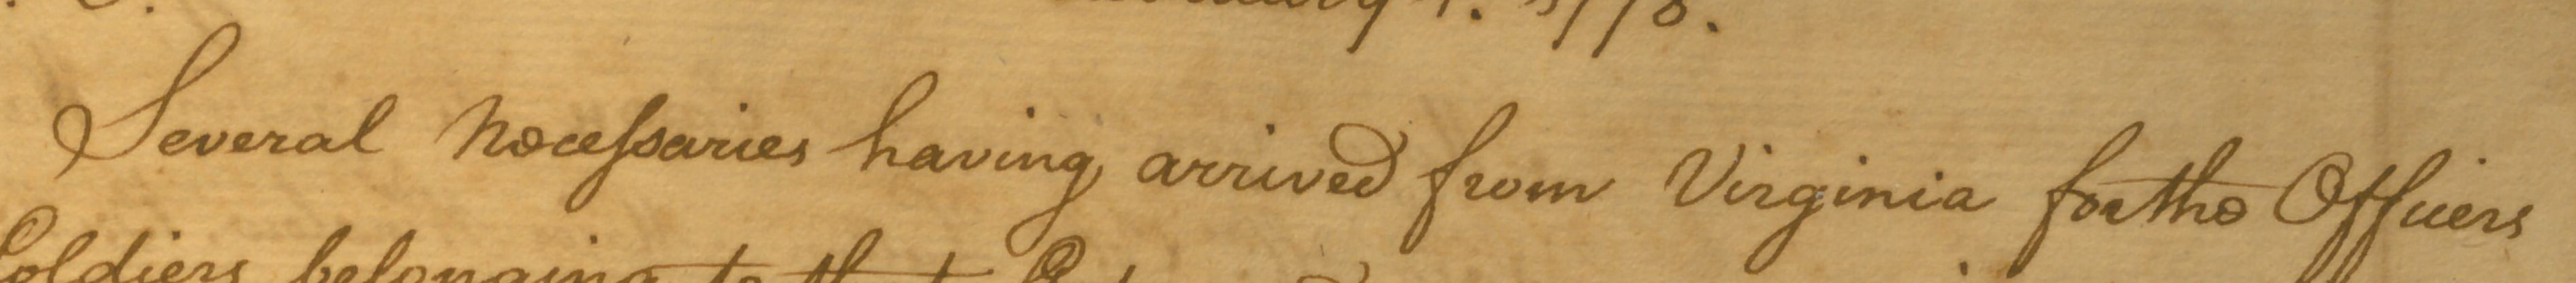Several necessaries having arrived from Virginia for the Officers
